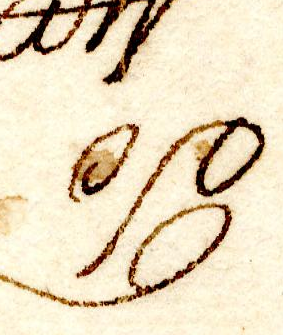To
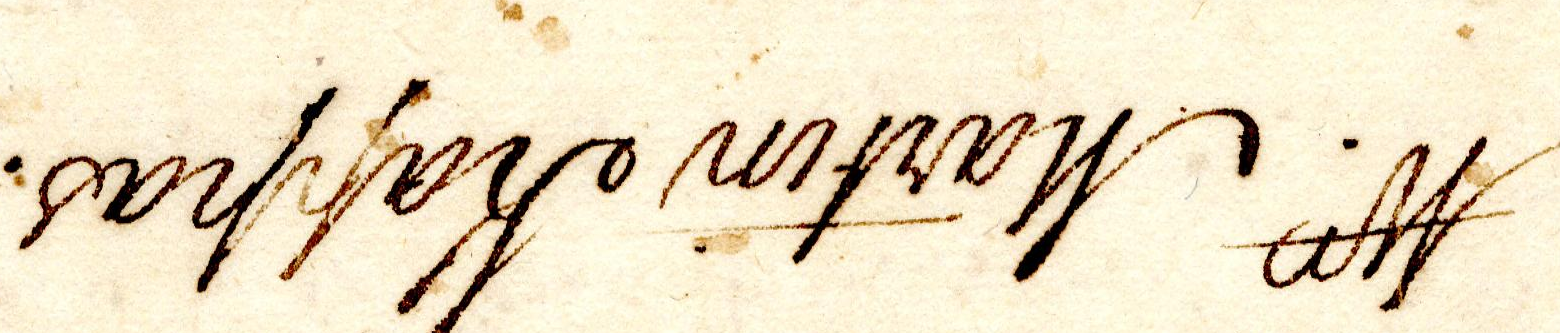M^r. Martin Kappas.
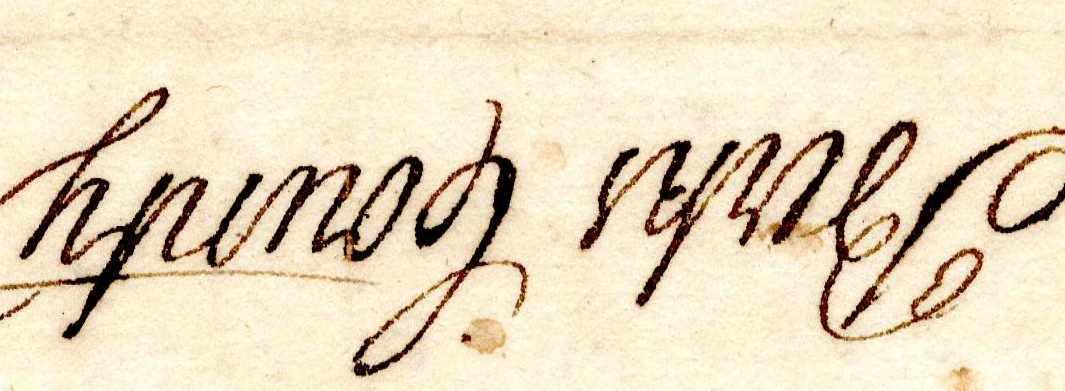Birks County
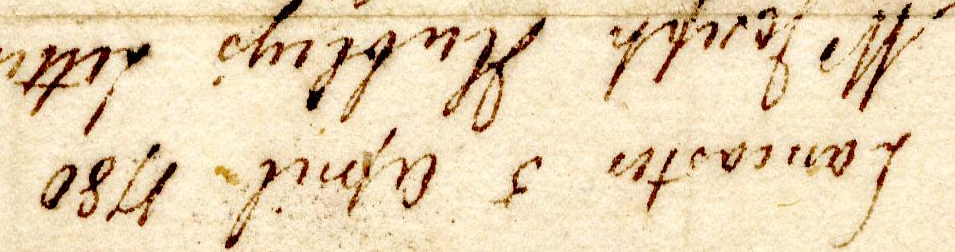Lancaster 5 April 1780
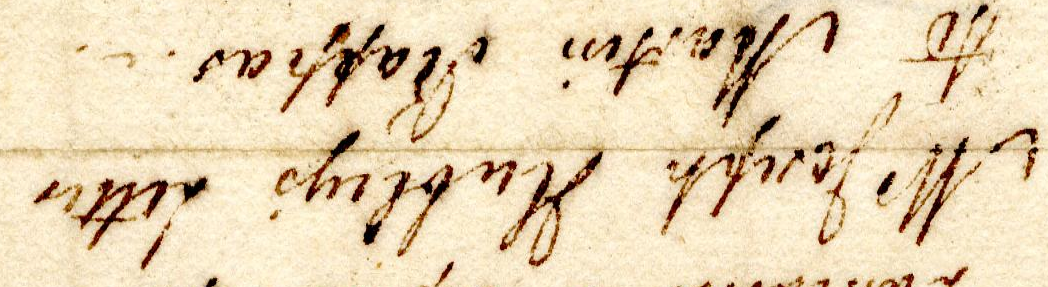M^r. Joseph Hubley's Letter
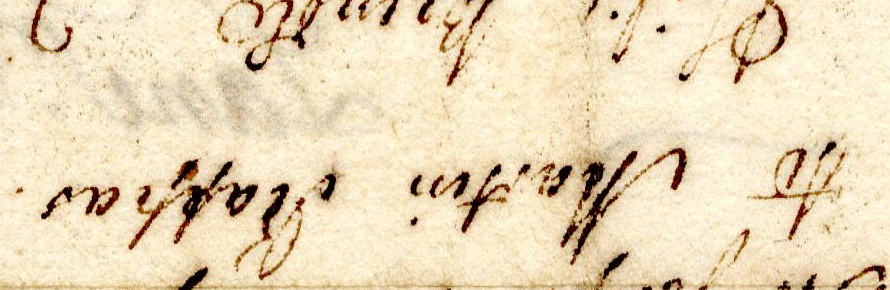to Martin Kappas
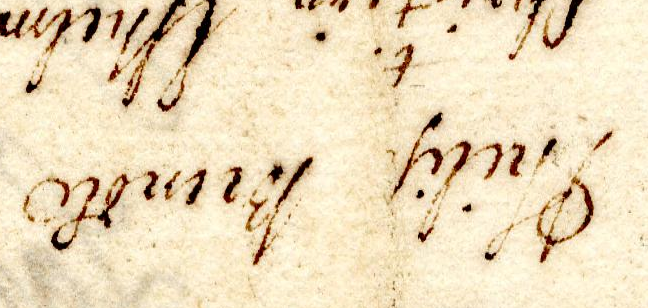Philip Brendle
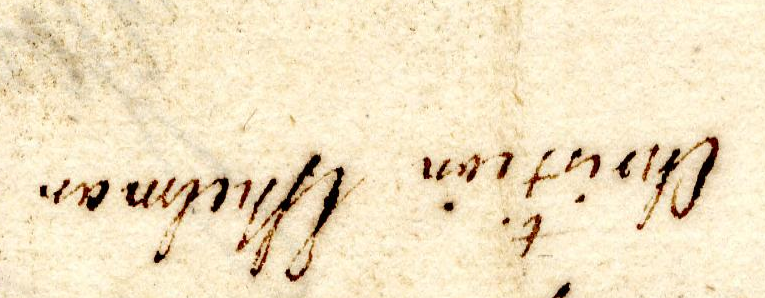Christian Chelman
